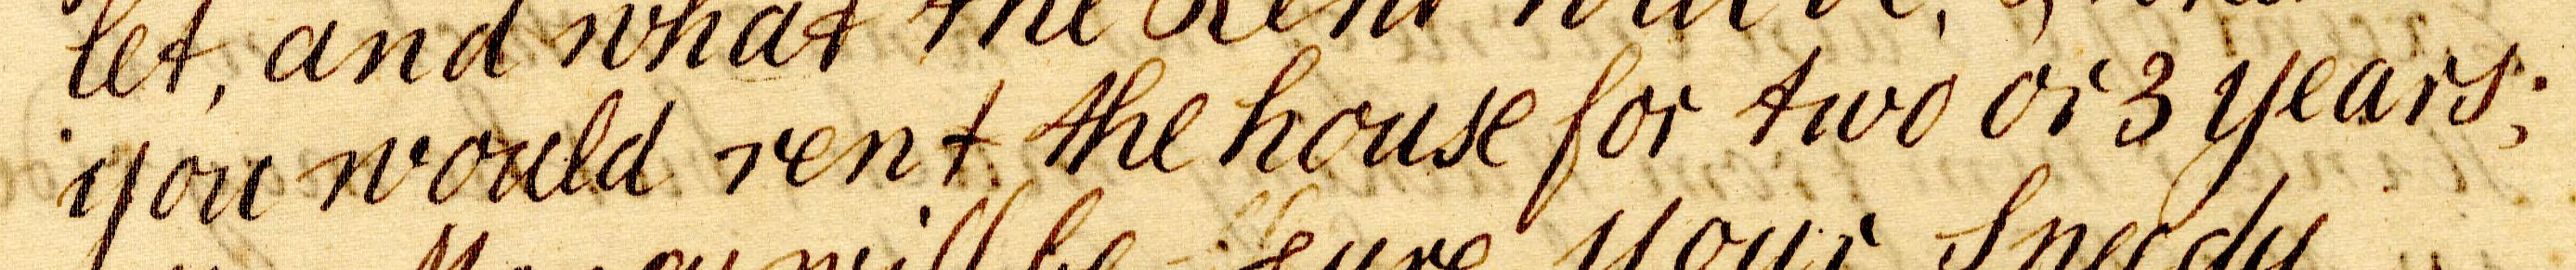you would rent the house for two or 3 years;
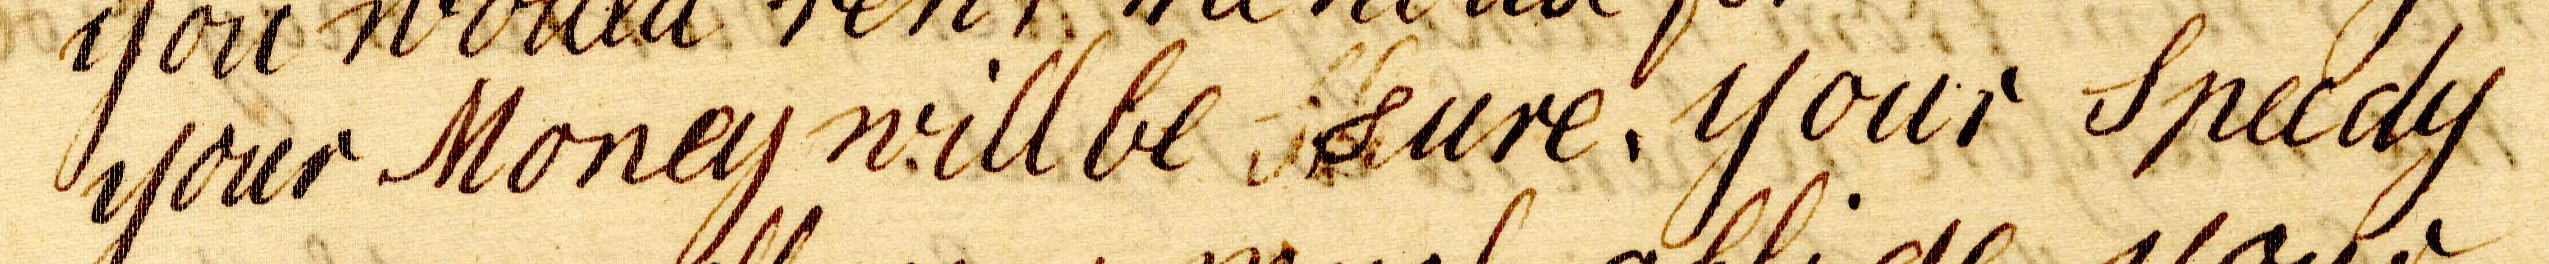your Money will be sure. Your speedy
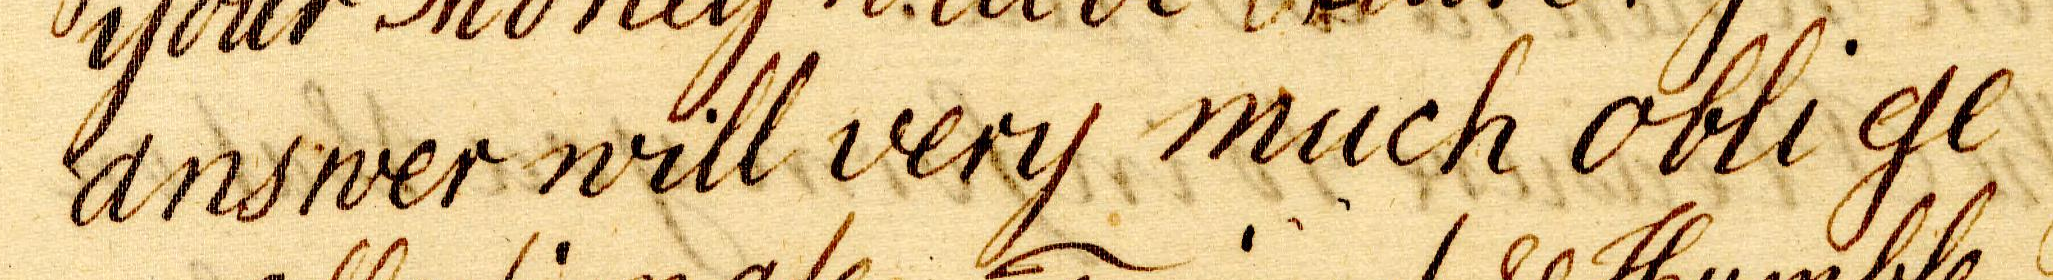answer will very much oblige
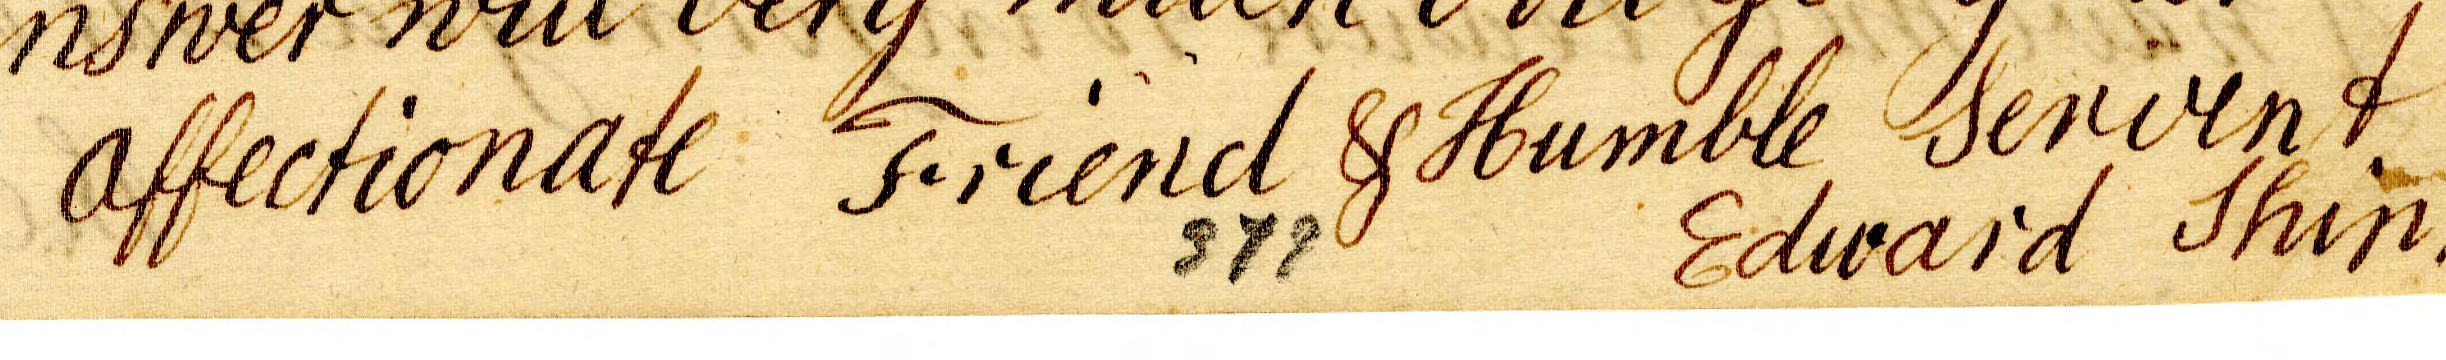Affectionate Friend & Humble Servent
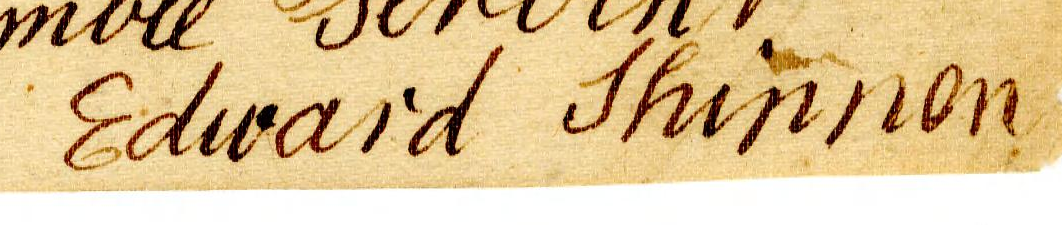Edward Shippen
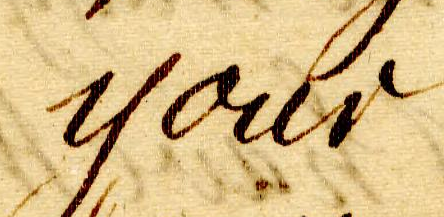your
